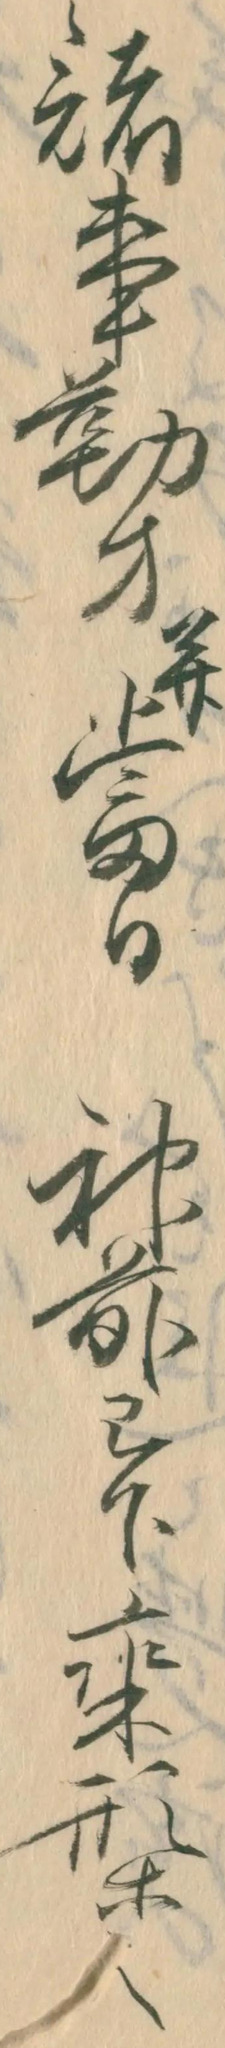諸事勤方并当日神前已下乗形等之
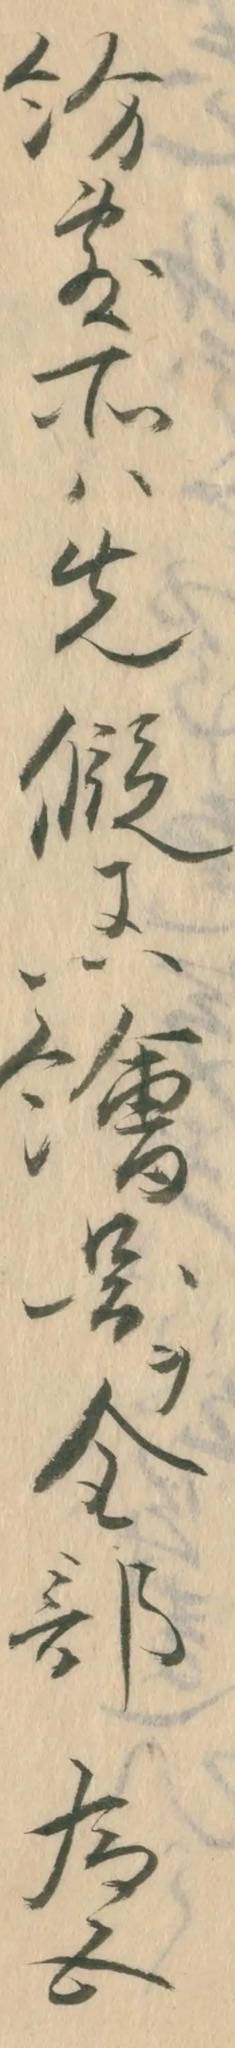紛敷所は先假に以絵図を全部五

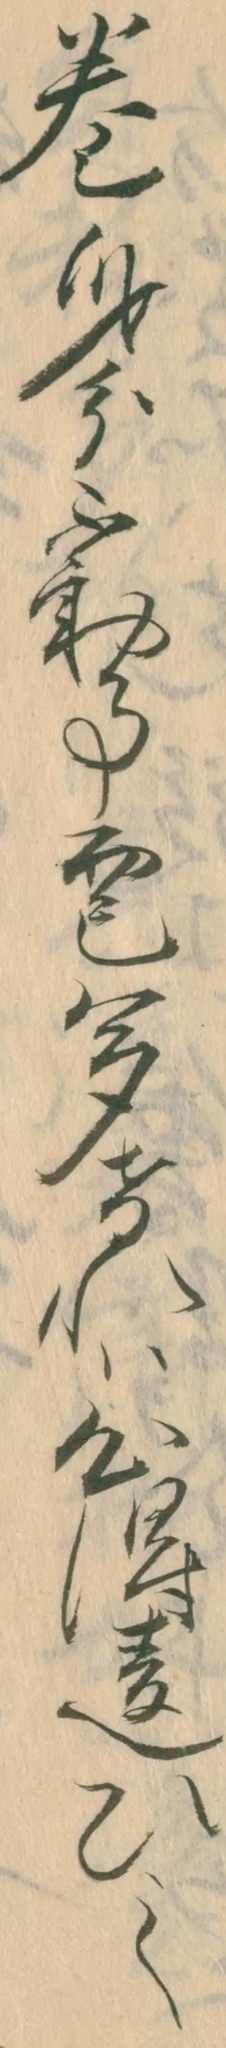巻身分不勤事而已多けれは心得違ひ之
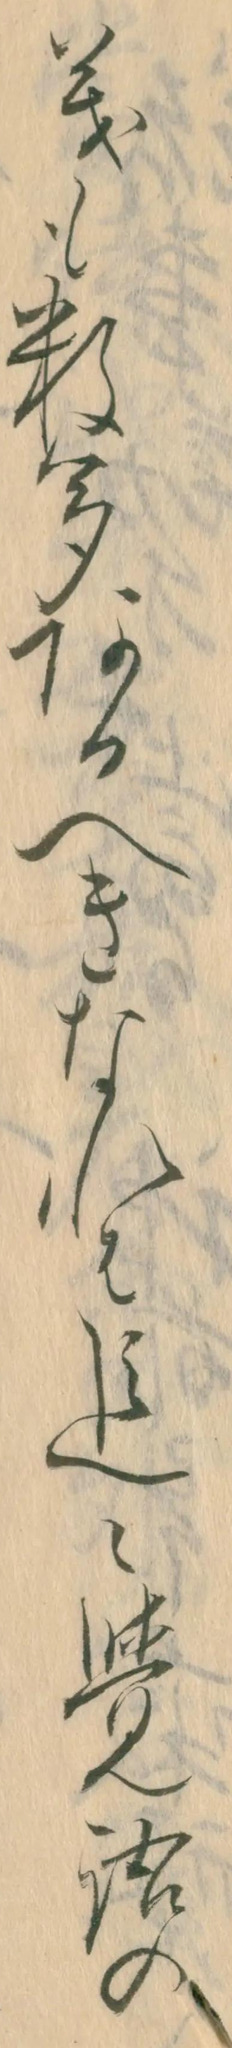義も数多あるへきなれは追々覚悟の
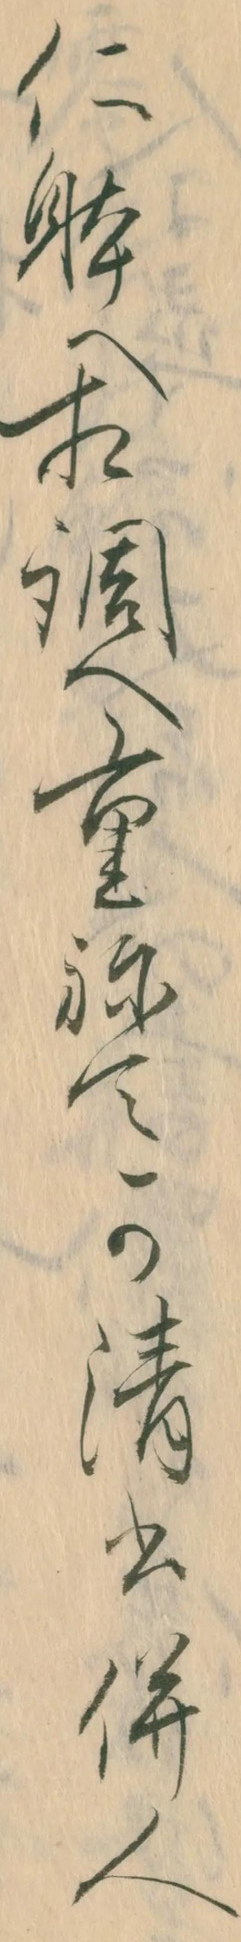仁体へ相調へ重ねて可清書併人
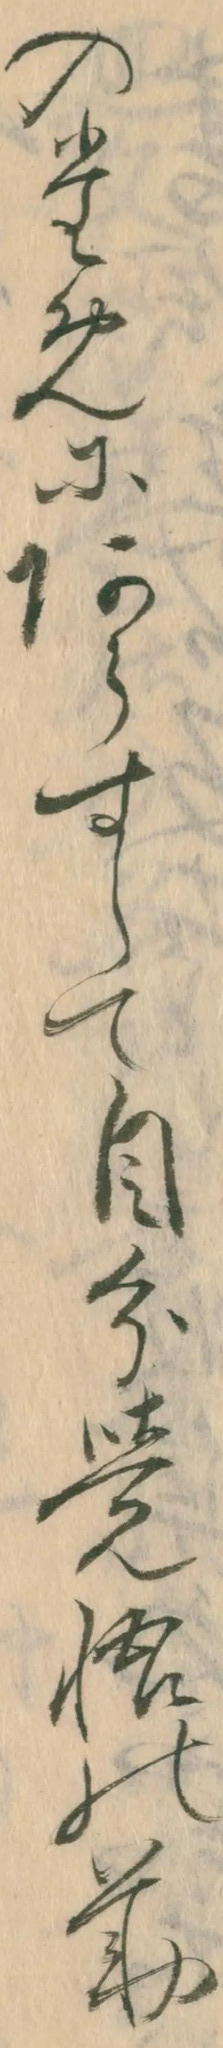のためにあらすして自分覚悟の勤
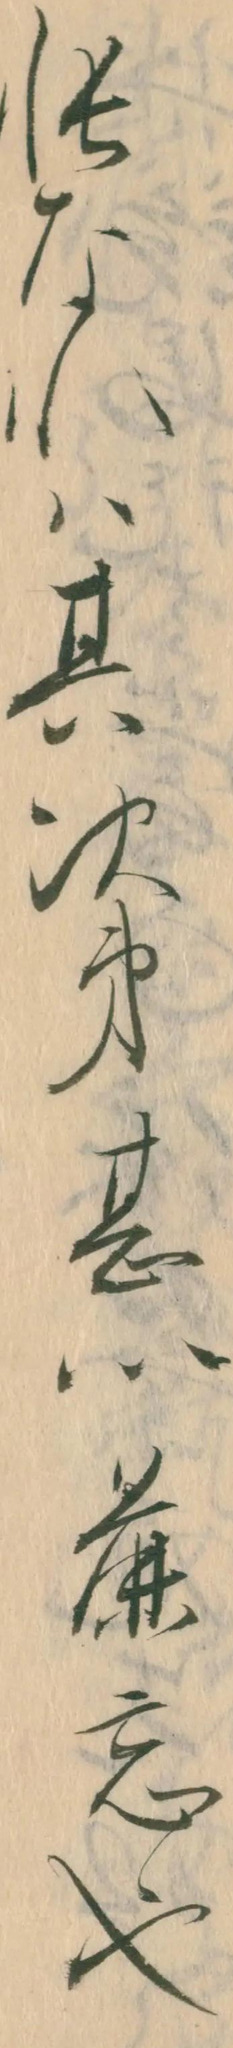帳なれは其次第甚以麤忘也
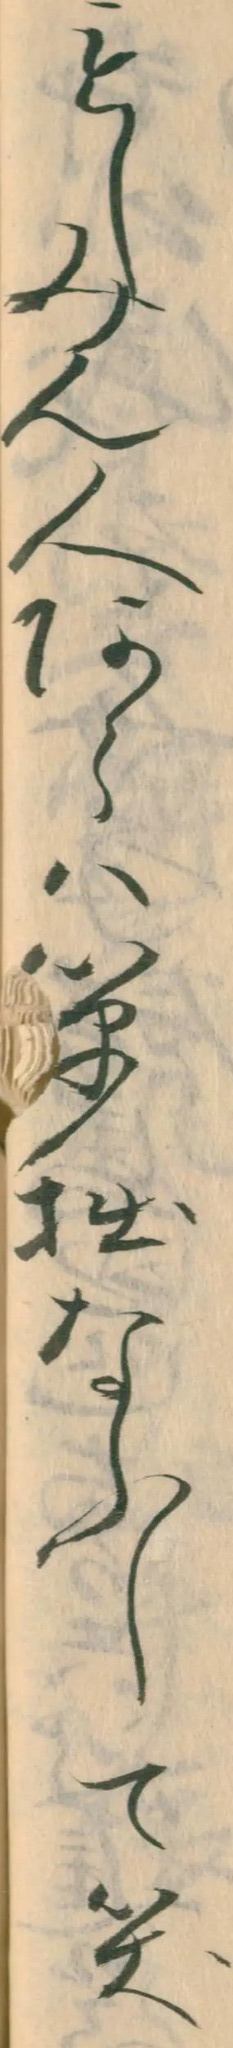もしみん人あらは筆拙なふして笑
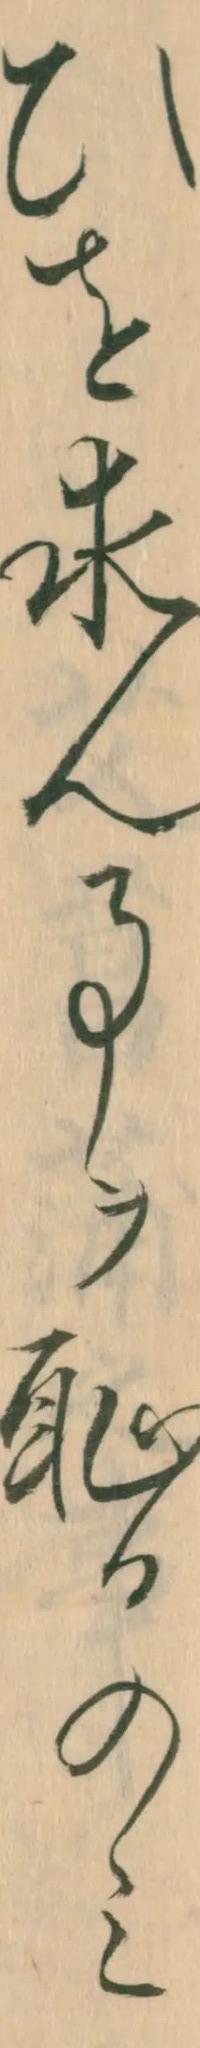ひを求ん事を恥るのみ
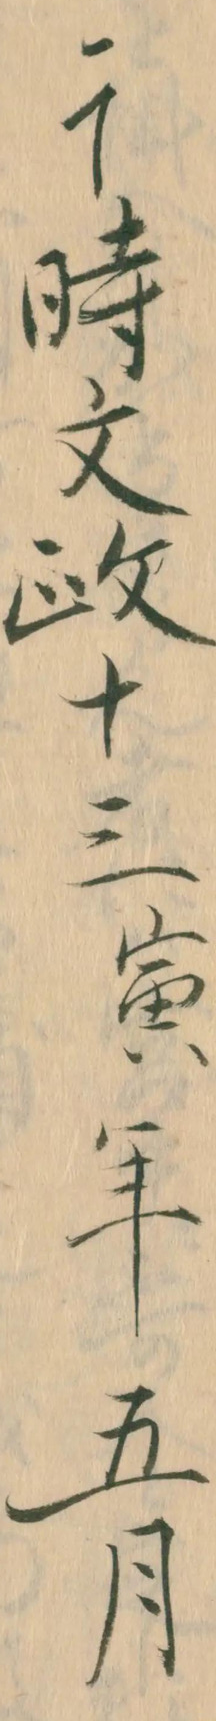于時文政十三寅年五月

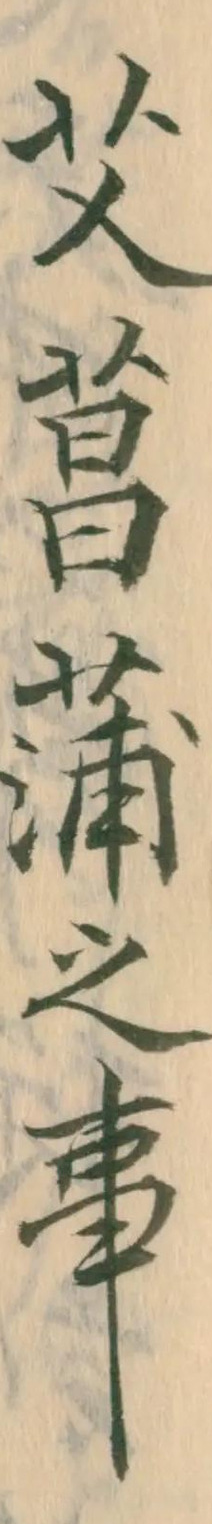艾菖蒲之事
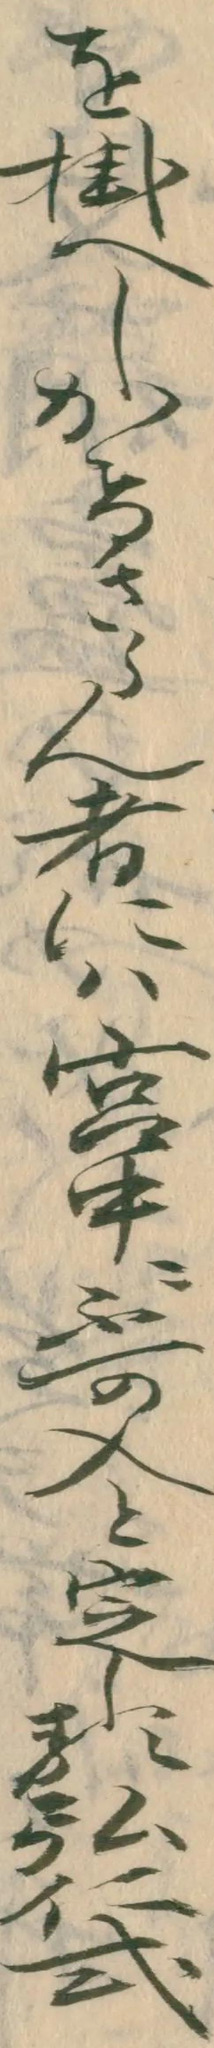を掛へしかけさらん者には宮中に不可入と定しる弘仁式
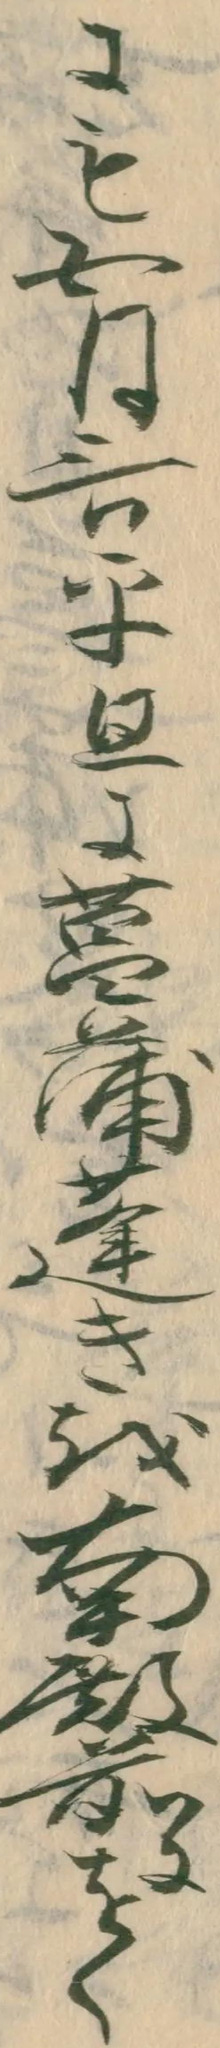にも五月三日平旦に菖蒲蓬きを南殿前にをく
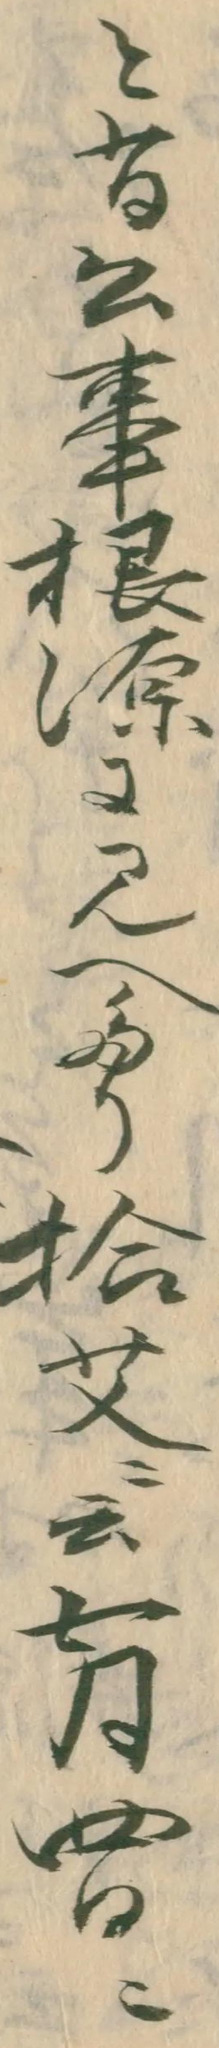と有公事根源に見へたり拾艾に云五月四日に
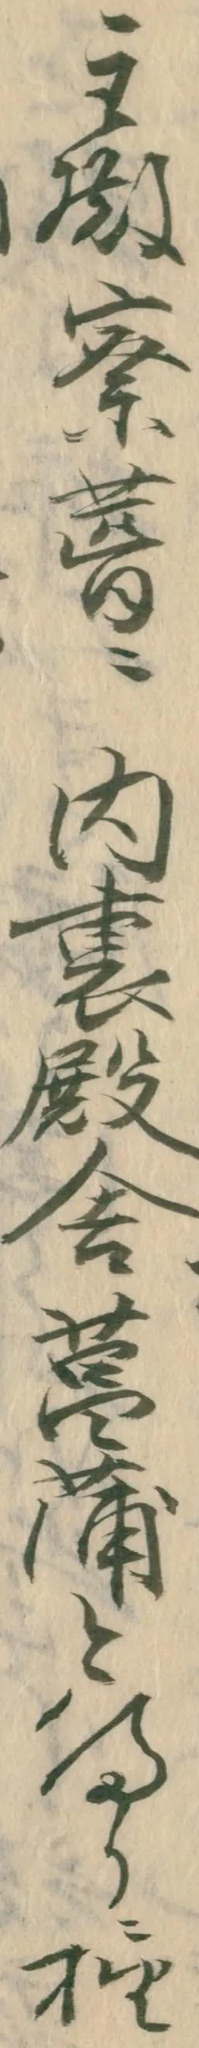主殿寮葺に内裏殿屋舎菖蒲り権
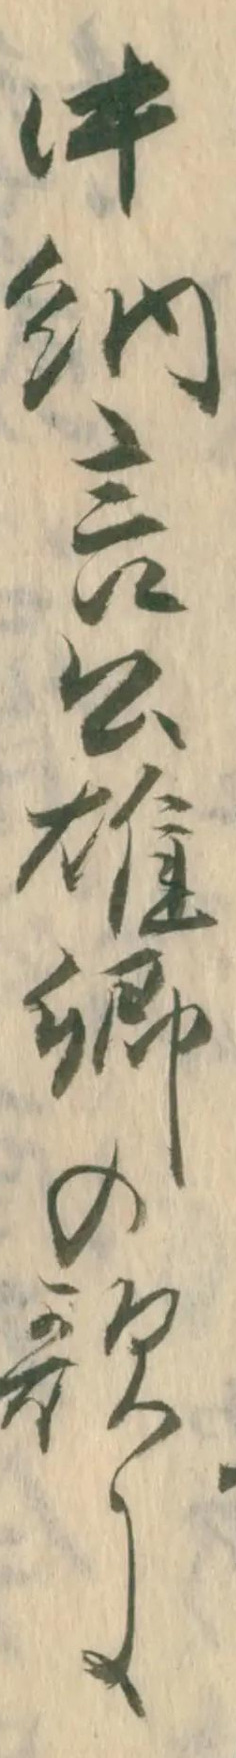中納言公雄卿の歌に
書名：賀茂社記録. 第12冊
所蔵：国立国会図書館 National Diet Library, JAPAN
